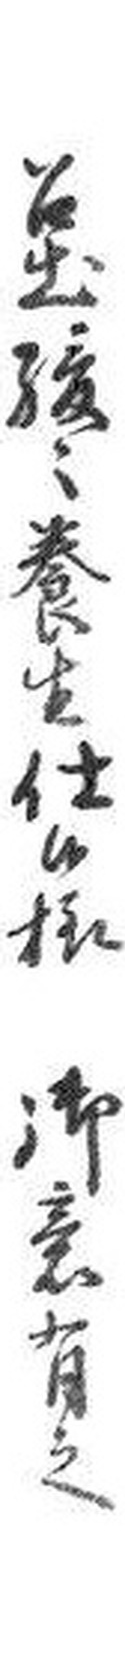召出緩々養生仕候様御意有之
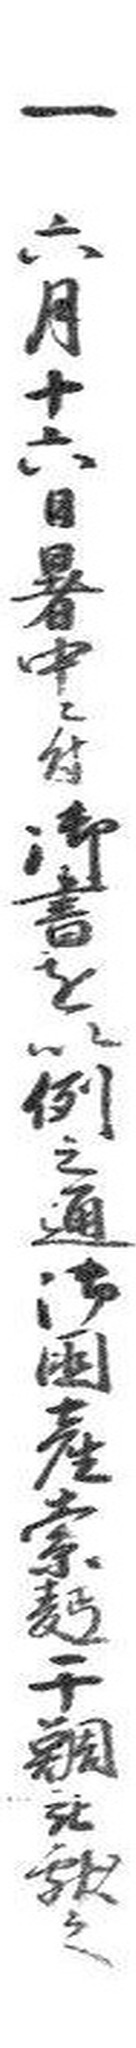一六月十六日暑中ニ付御書を以例之通御国産索麺干鯛被献之
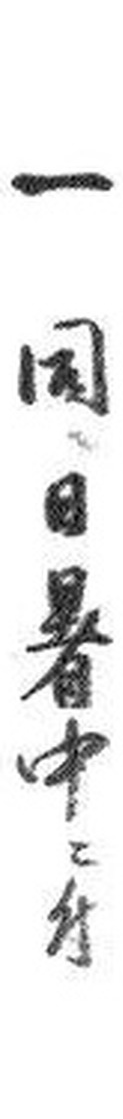一同日暑中ニ付
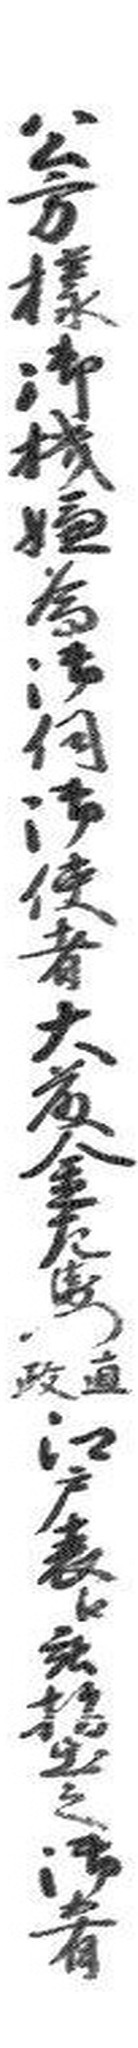公方様御機嫌為御伺御使者大藤金左衛門直政江戸表江被指出之御肴
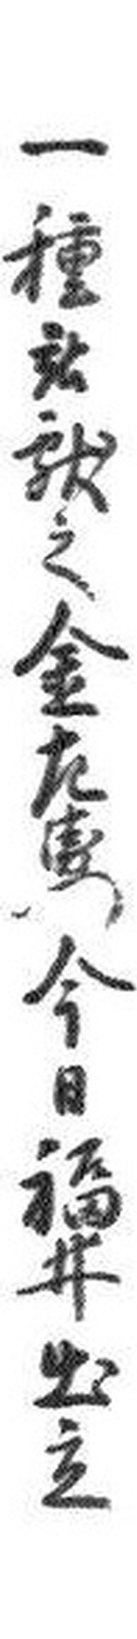一種被献之金左衛門今日福井出立
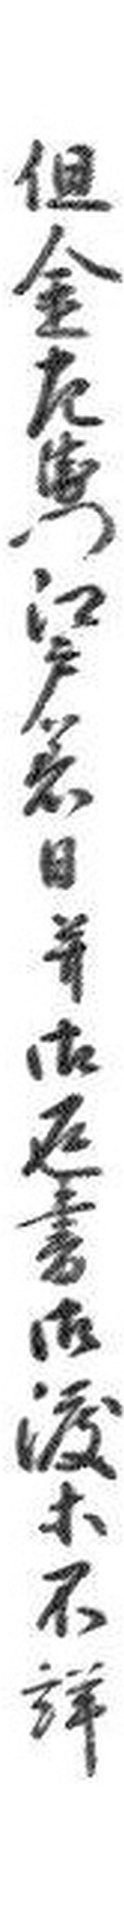但金左衛門江戸着日并御返書御渡等不詳
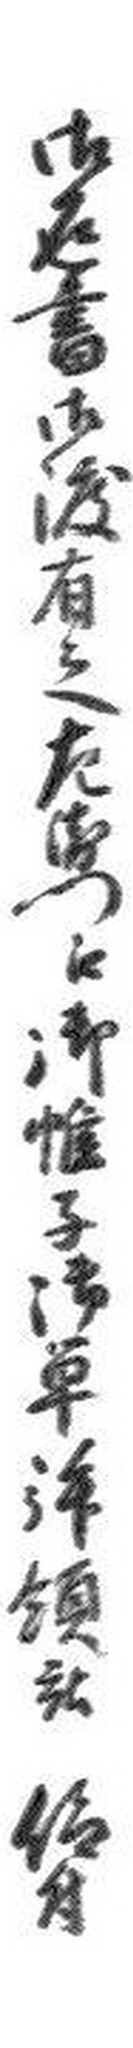御返書御渡有之左衛門江御帷子御単拝領被仰付
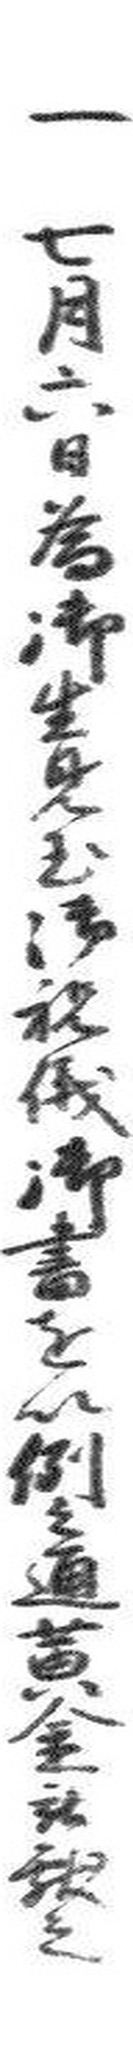一七月六日為御生見玉御祝儀御書を以例之通黄金被献之
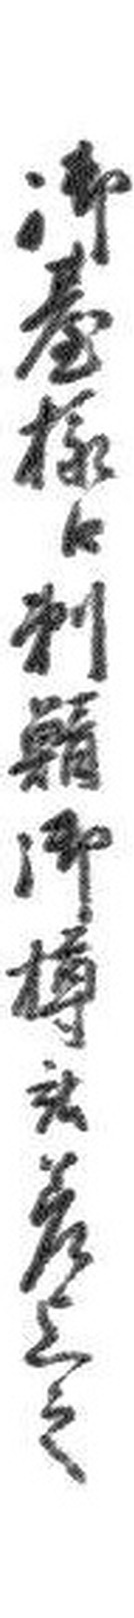御台様江刺鯖御樽被差上之
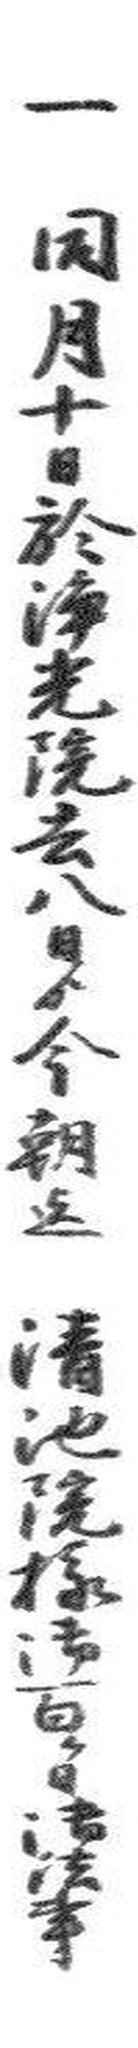一同月十日於浄光院去八日ゟ今朝迄清池院様御百ケ日御法事
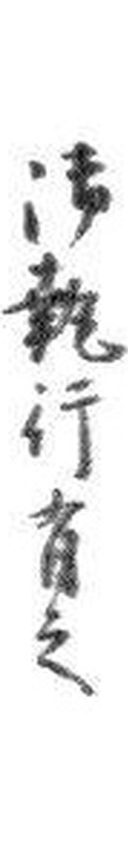御執行有之
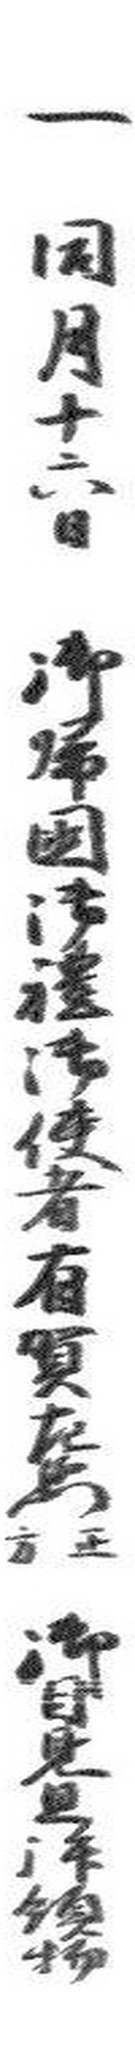一同月十六日御帰国御礼御使者有賀左衛門正方御目見且拝領物
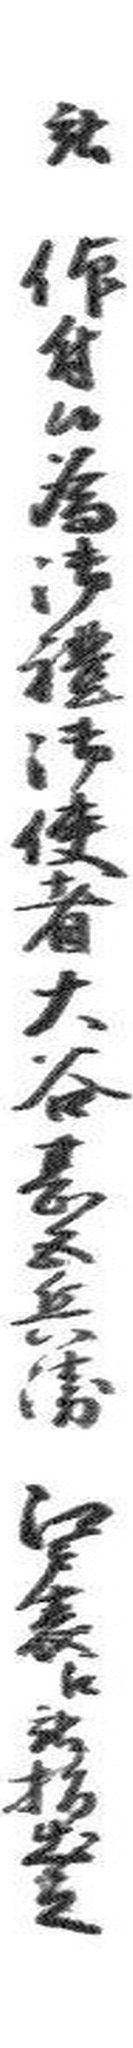被仰付候為御礼御使者大谷甚五兵衛江戸表江被指出之
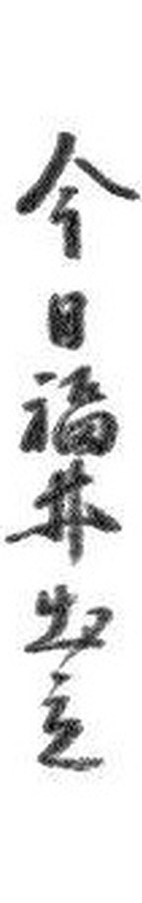今日福井出立
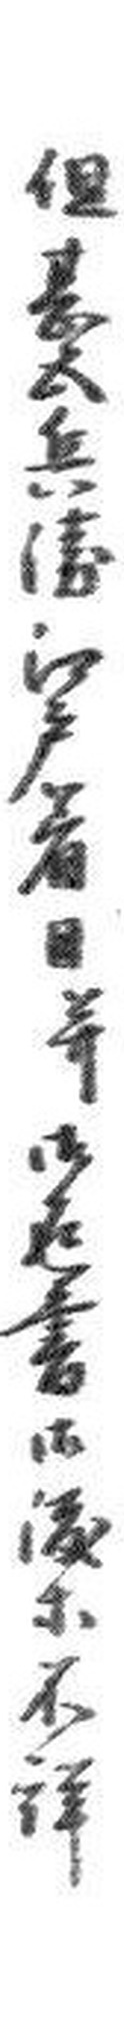但し甚五兵衛江戸着日并御返書御渡等不詳

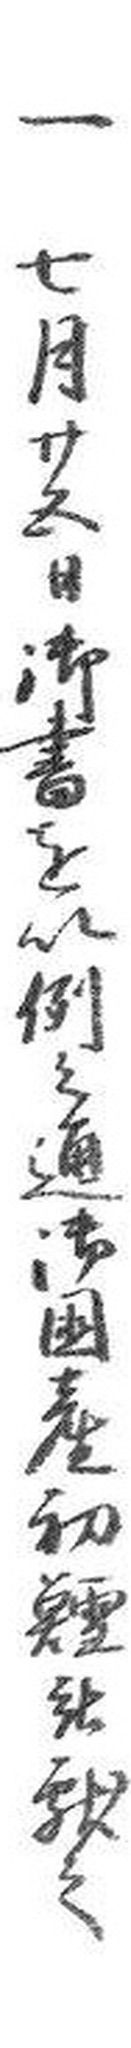一七月廿五日御書を以例之通御国産初鱈被献之
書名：家譜 八 光通公 従寛文十年到同十二年
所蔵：福井県文書館 Fukui Prefectural Archives
